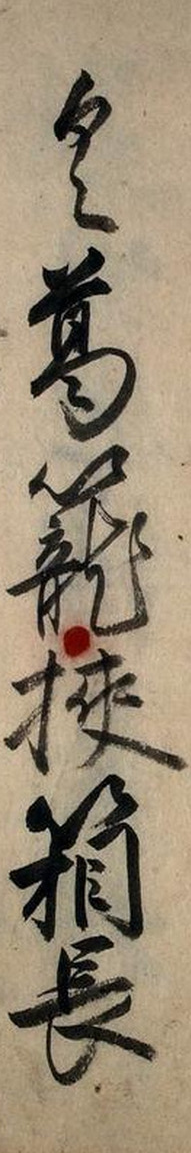具葛籠挾箱長
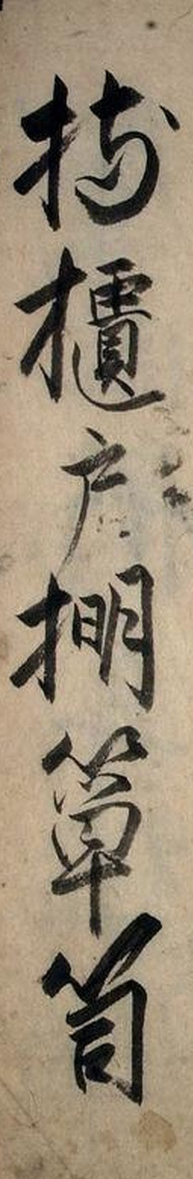持櫃戸棚箪笥

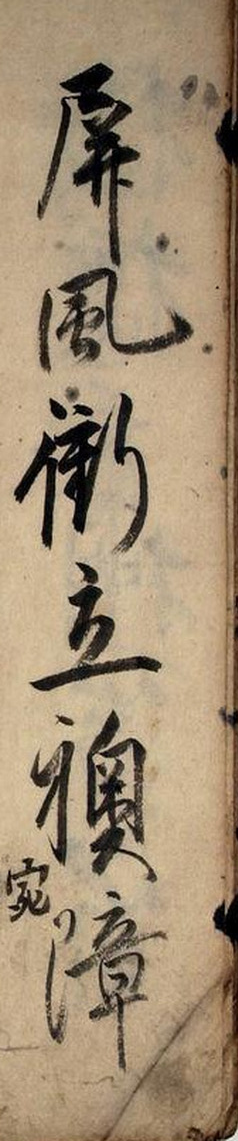屏風衝立襖障
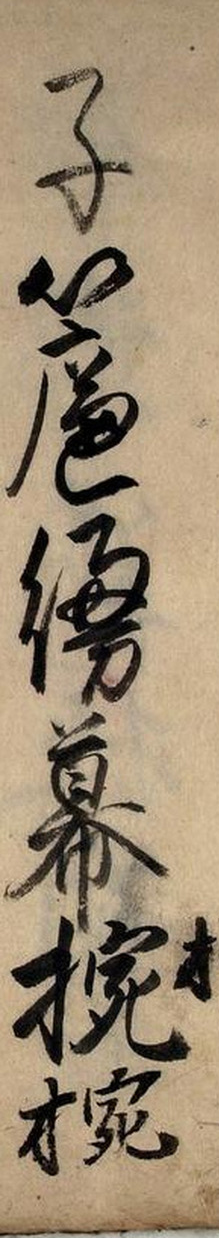子簾縵幕椀椀
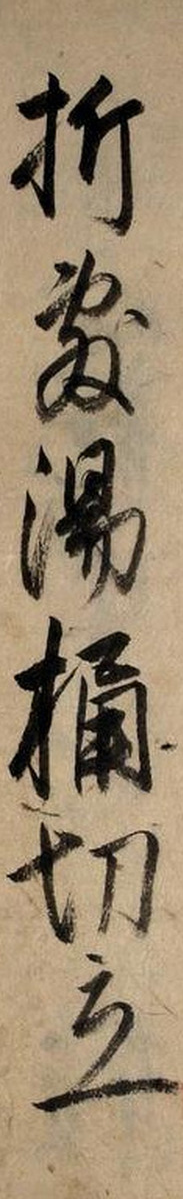折敷湯桶切立
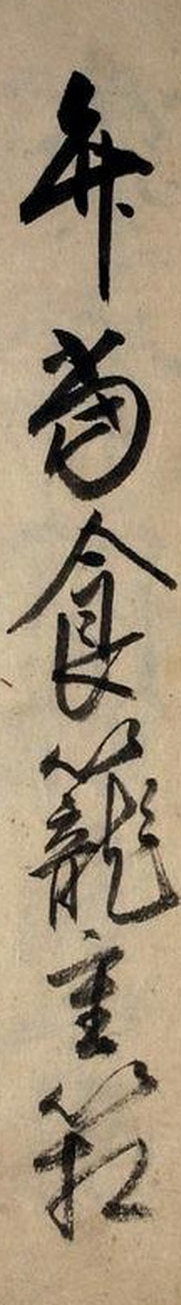弁当食籠重箱
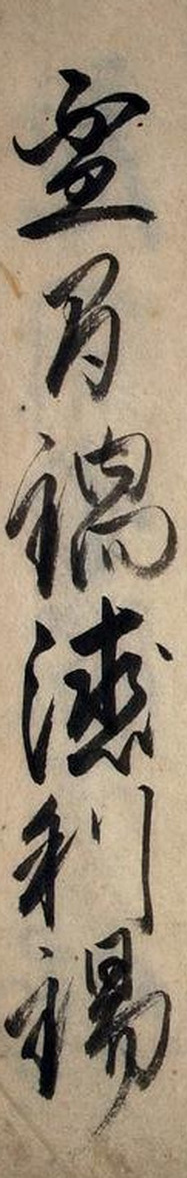盃間鍋徳利錫

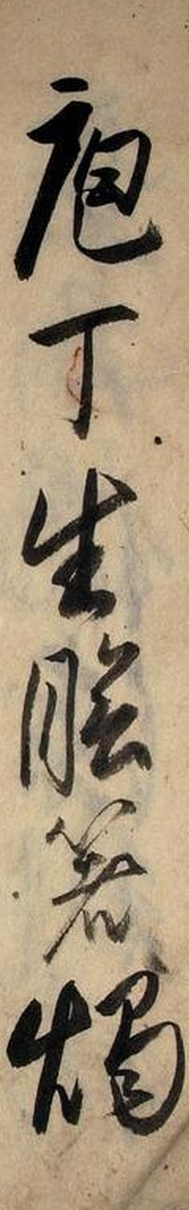包丁生膾箸燭
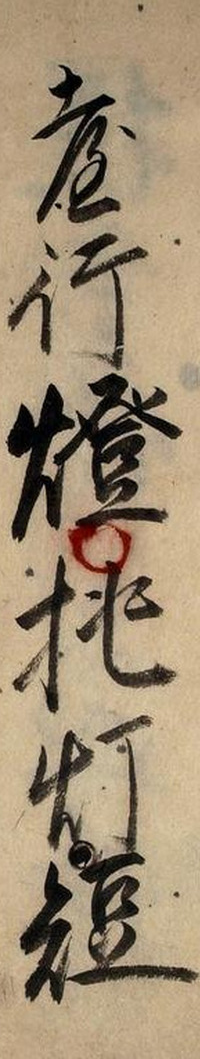台行燈挑灯短
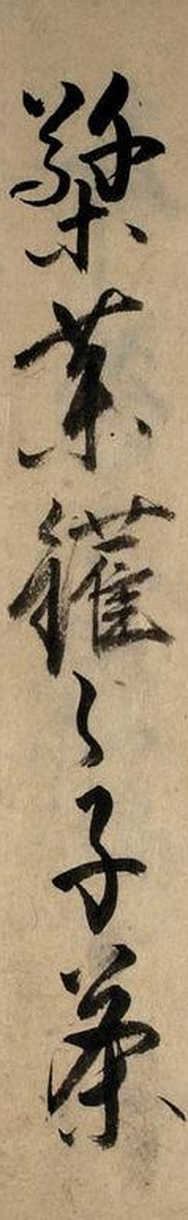檠薬鑵々子茶
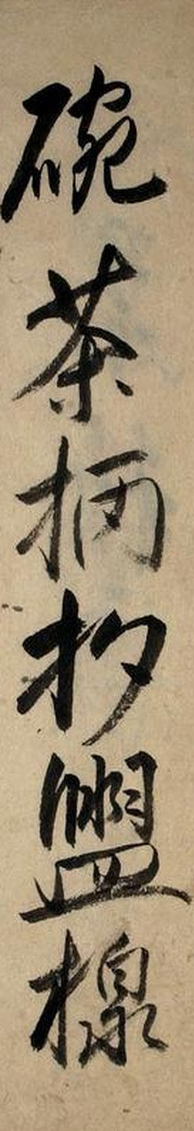碗茶柄杓盥楾
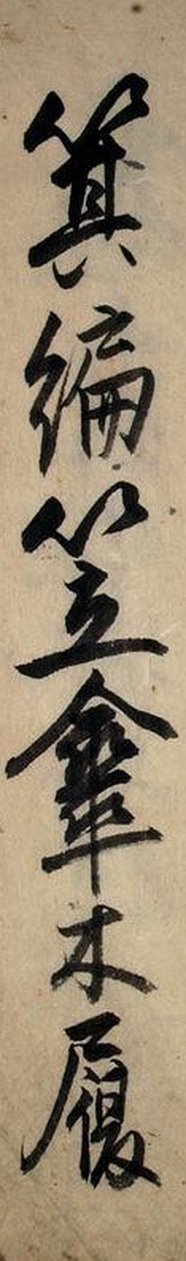箕編笠傘木履

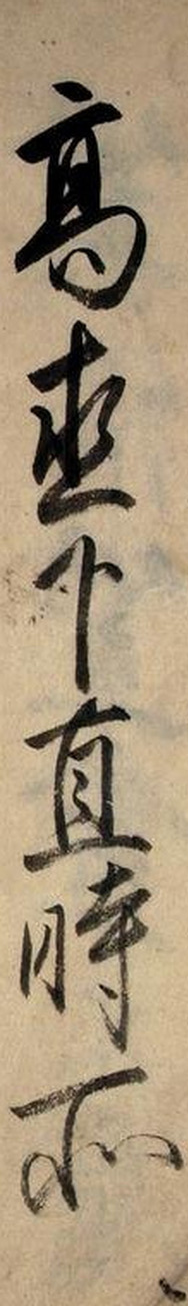高直下直時所
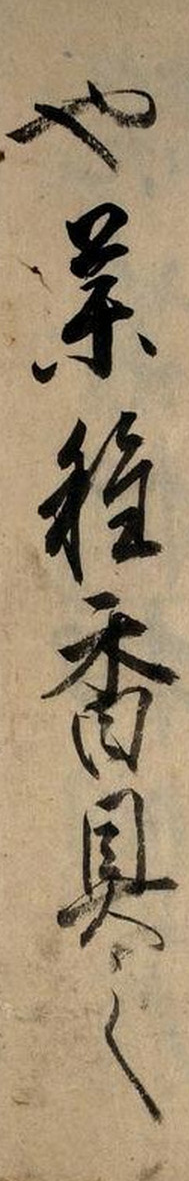也薬種香具之
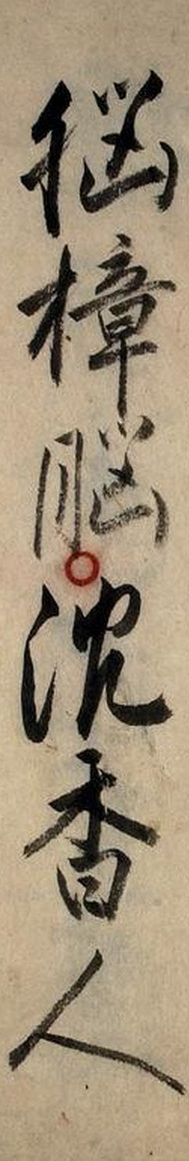脳樟脳沈香人
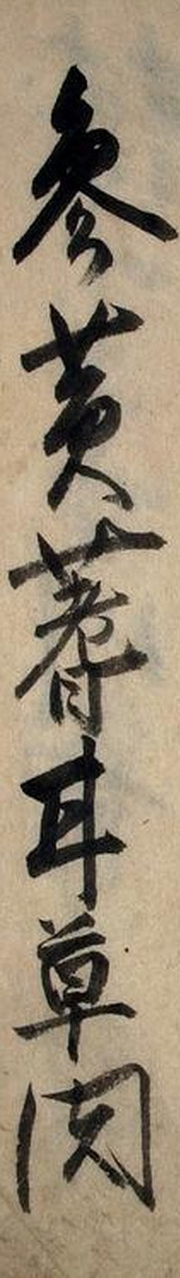参黄蓍甘草肉
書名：商売往来（往来物、手習手本）
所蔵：福井県文書館 Fukui Prefectural Archives
